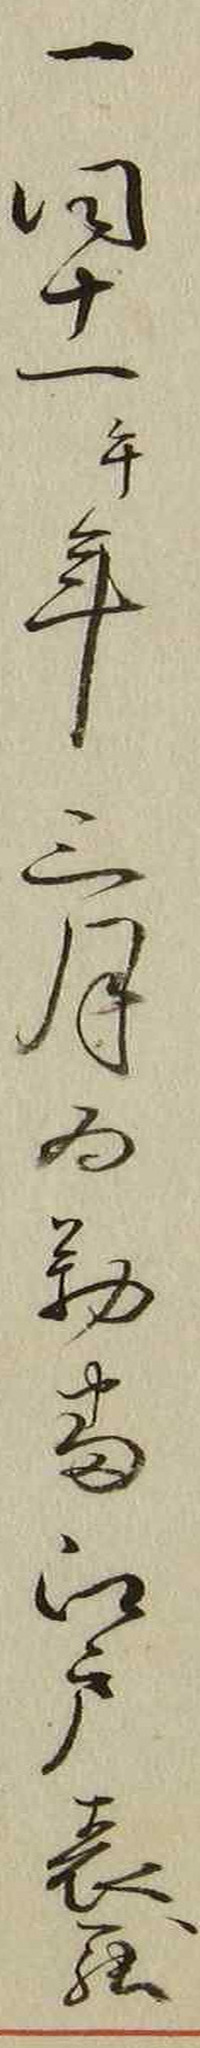一同十一午年三月為勤番江戸表へ罷
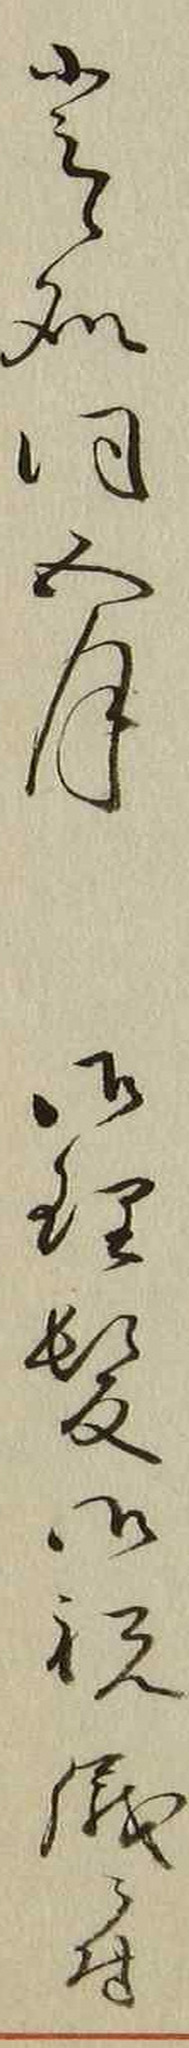登候処同五月御理髪御祝儀ニ付
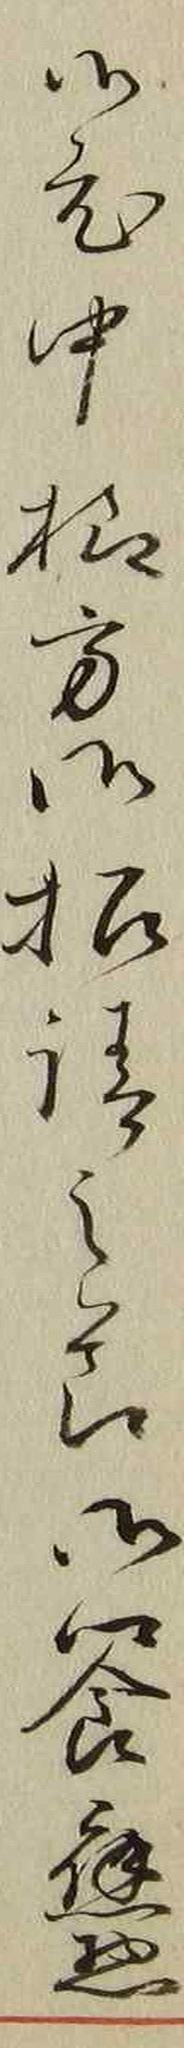御老中様方御招請之節御饗応惣
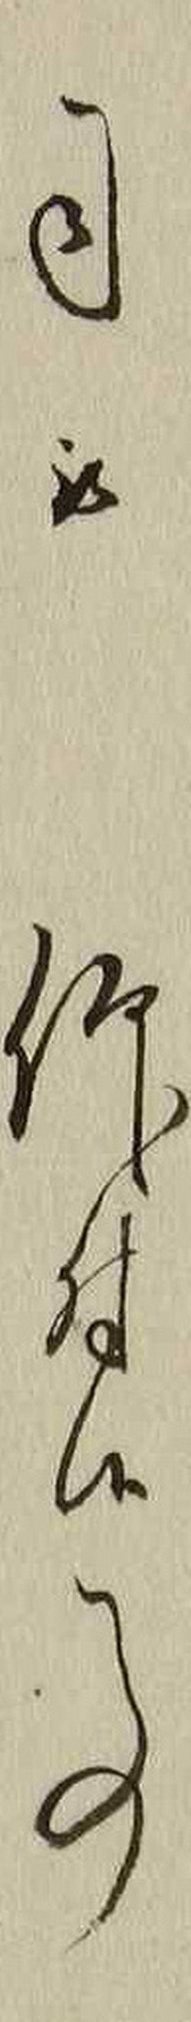司被仰付候事
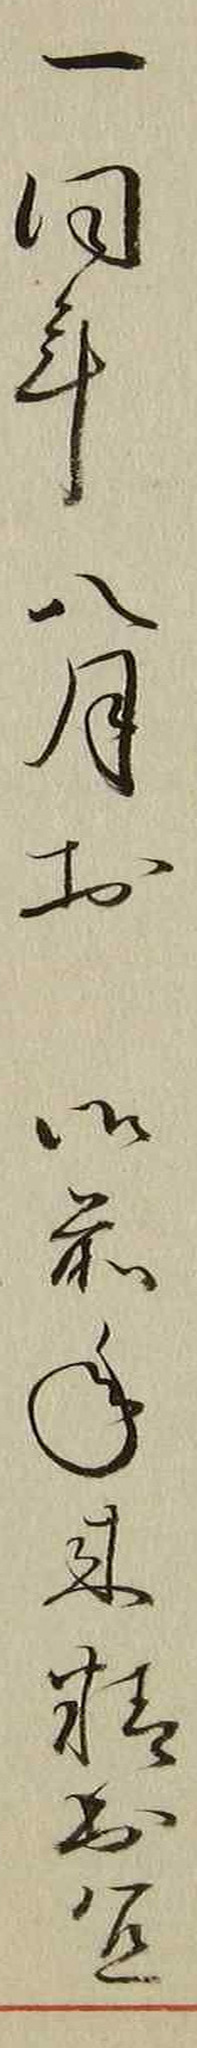一同年八月於御前年来精出宜
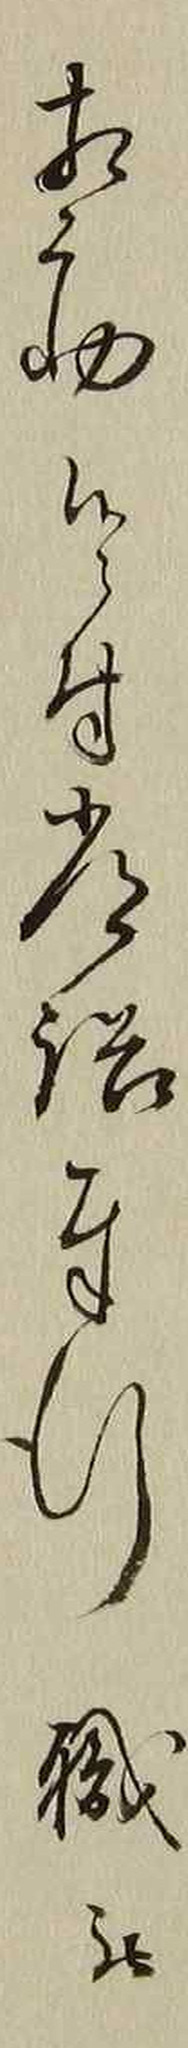相勤候ニ付常詰奉行職被
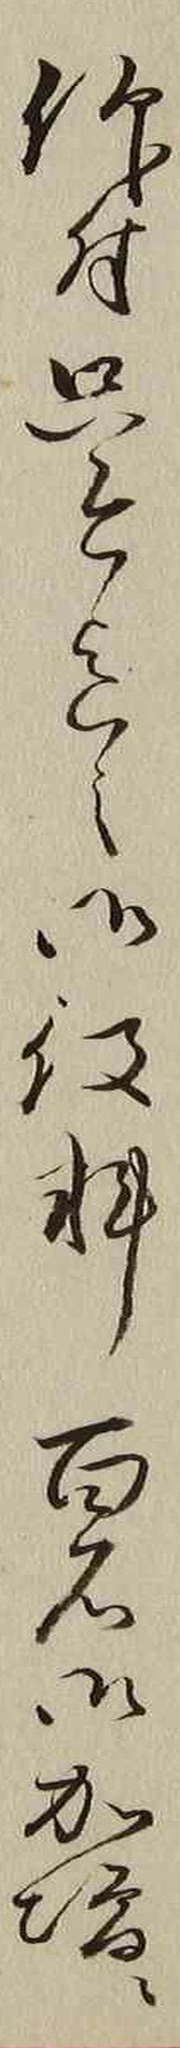仰付只今迄之御役料百石御加増ニ
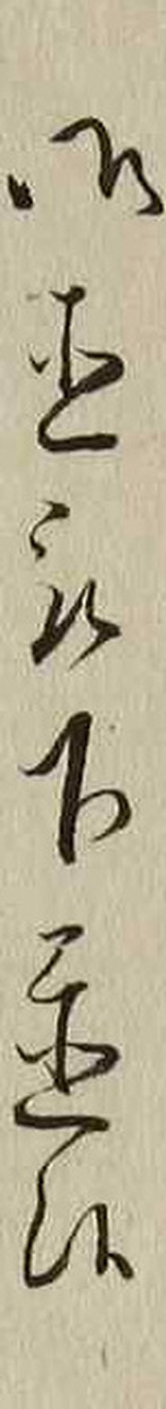御直被下置候
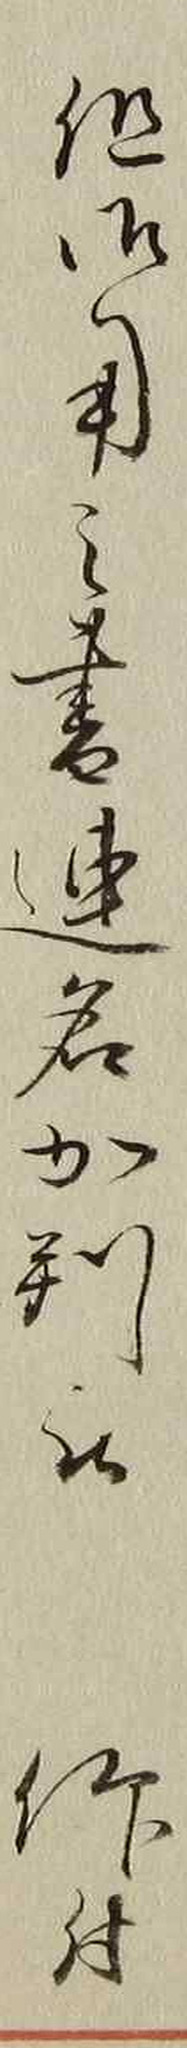但御用之書連名加判被仰付
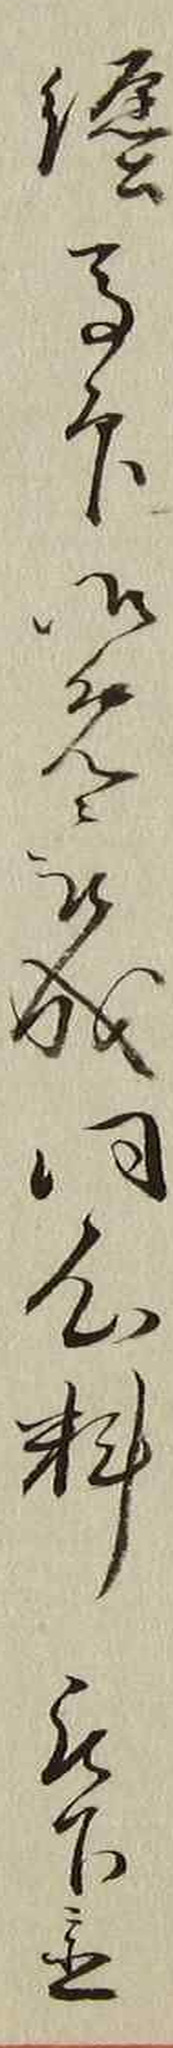纏馬印御免ニ相成同心料被下置
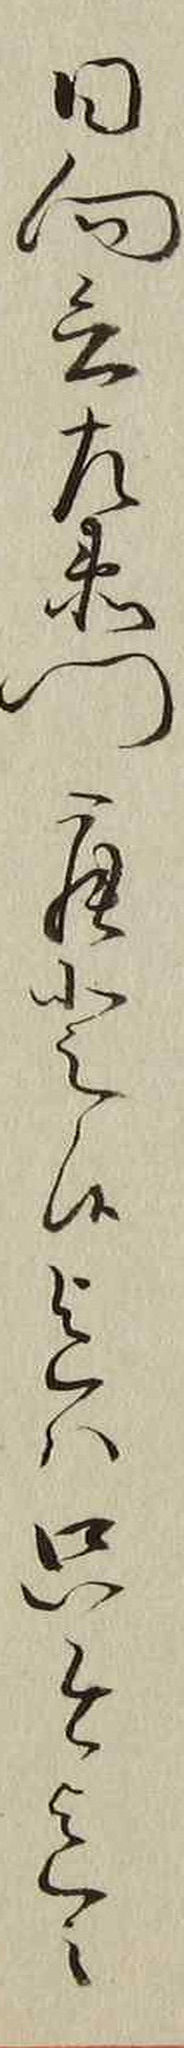日向言左衛門罷登候迄ハ只今迄之
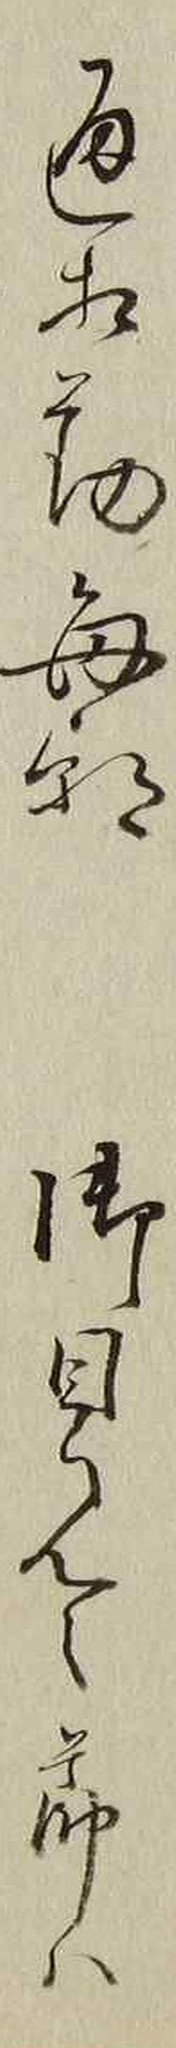通相勤毎朝御目見之節ハ
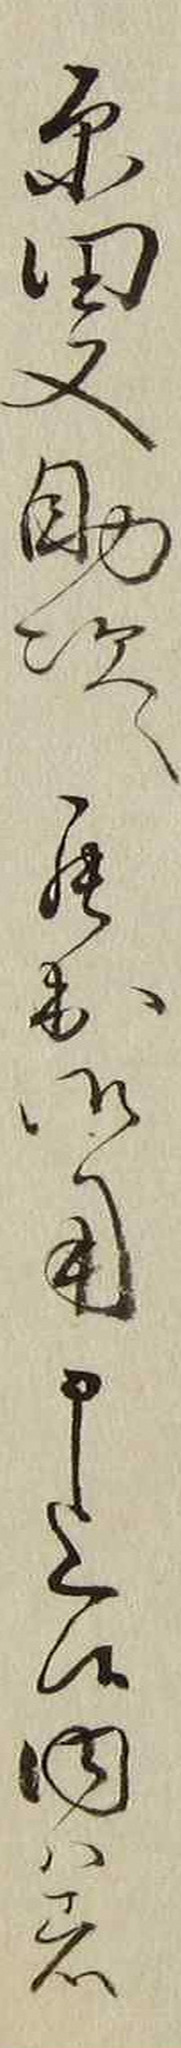原田又助次へ罷出御用申上候内ハ着
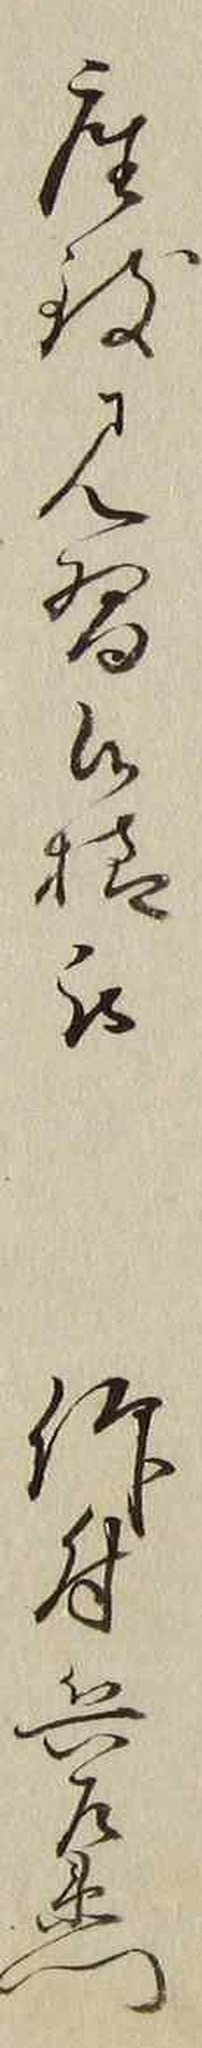座致見習候様被仰付兵左衛門
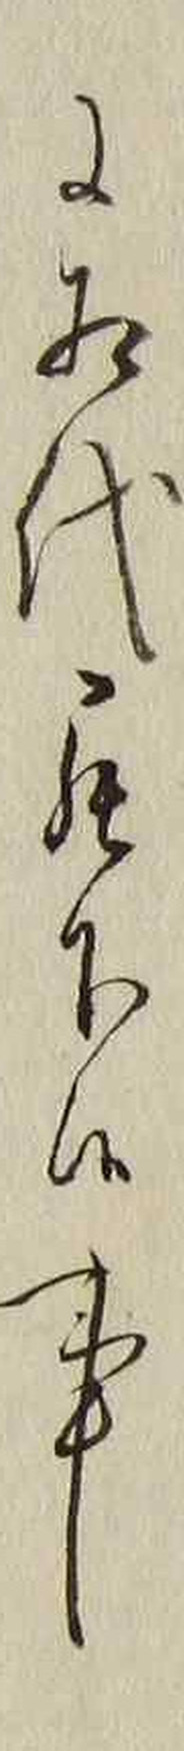に相代罷下候事
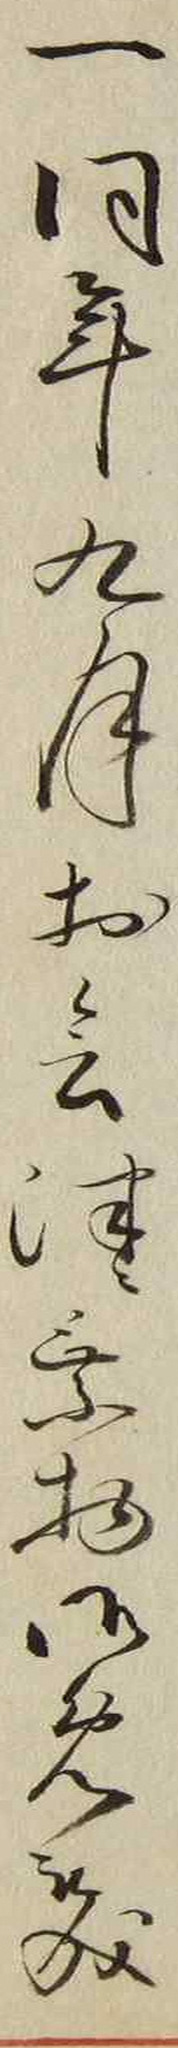一同年九月於会津ニ乗物御免被成
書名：諸士系譜　巻之2　い之部2
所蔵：会津若松市立会津図書館
